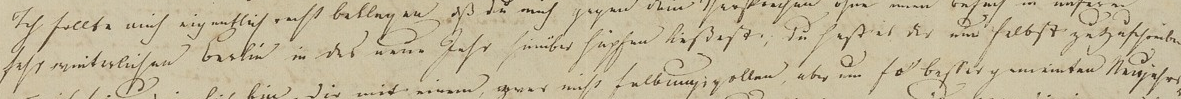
sehr winterlichen Berlin in das neue Jahr hinüber hüpfen ließest; du hast dir nur selbst zuzuschreiben
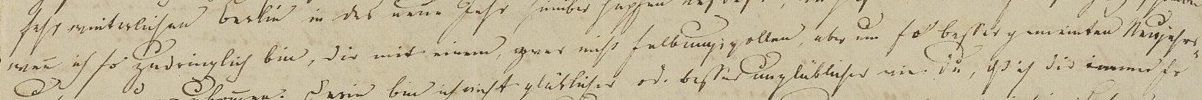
wenn ich so zudringlich bin, dir mit einem, zwar nicht salbungsvollen, aber um so besser gemeinten Neujahr -
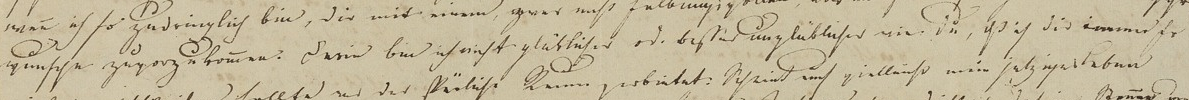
wunsche zuvorzukommen. Darin bin ich nicht glüklicher od. besser unglüklicher wie du, dß ich dir immer so
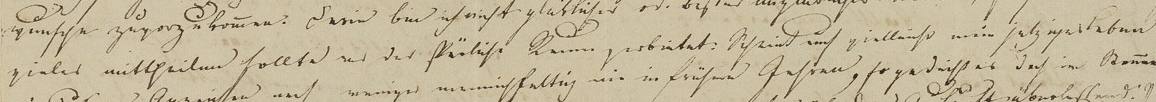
vieles mittheilen sollte was der spärliche Raum verbietet. Scheint auch vielleicht mein jetziges Leben
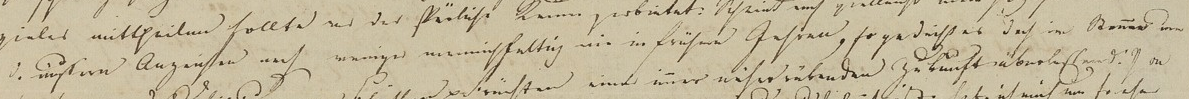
d. äussern Anzeichen nach weniger mannichfaltig wie in frühern Jahren, so gedeiht es doch im Stamme um
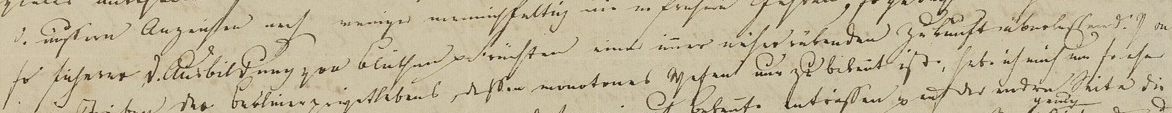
so sicherer, d. Ausbildung von Blüthen & Früchten einer immer näher rükenden Zukunft überlassend. Von
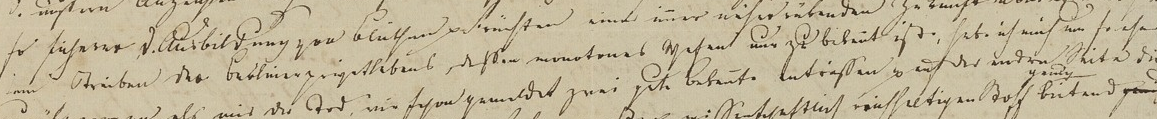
dem Treiben des Berlinerprivatlebens, dessen monotones Wesen nur zu bekannt ist, habe ich mich um so eher
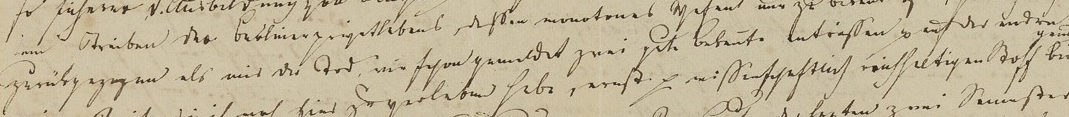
zurükgezogen als mir der Tod, wie schon gemeldet zwei gute Bekannte entrissen & auf der andern
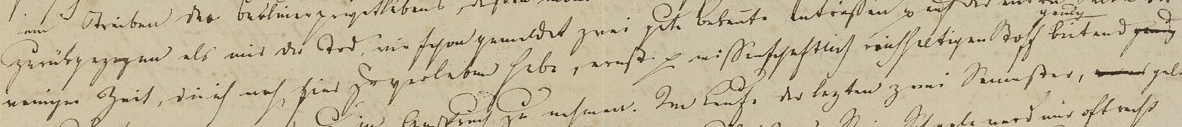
wenige Zeit, die ich noch hier zu verleben habe, ernst & wissenschaftlich reichhaltigen Stoff genug bietend genug
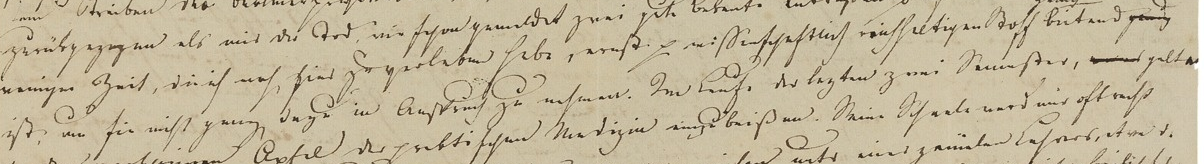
ist, um sie nicht ganz dazu in Anspruch zu nehmen. Im Laufe der lezten zwei Semester, ... es galt es
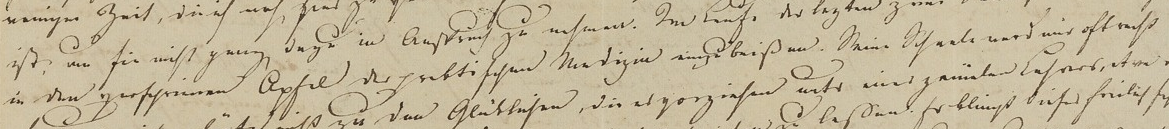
in den verschrienen Apfel der praktischen Medizin einzubeißen. Seine Schaale ward mir oft recht
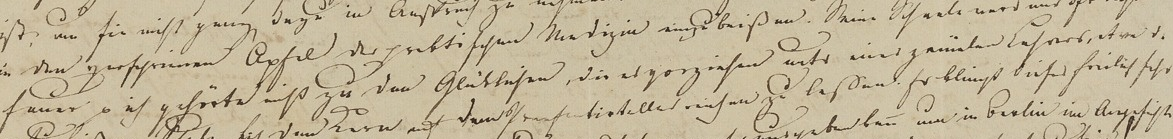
sauer & ich gehörte nicht zu den Glüklichen, die es vorziehen untr eines genialen Lehrers, etwa d.
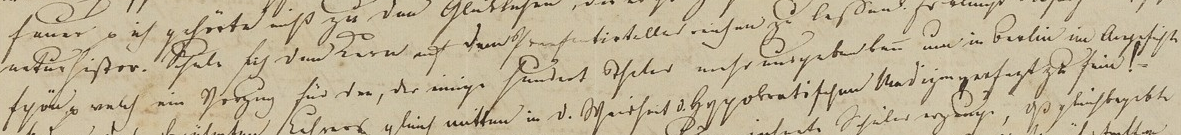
schön & welch ein Vorzug für den, der einige hundert Thaler mehr ausgeben kann um in Berlin im Angesichte
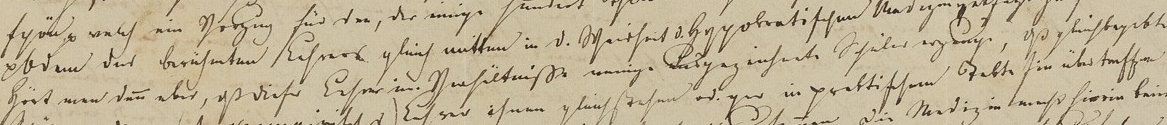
Hört man dann aber, dß dieser Lehrer im Verhältnisse wenige ausgezeichnete Schüler erzeuge, dß gleichbegabte
